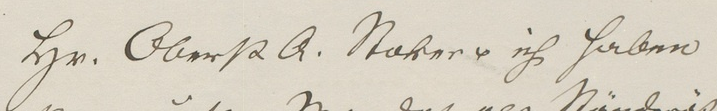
Hr. Oberst A. Stoker & ich haben
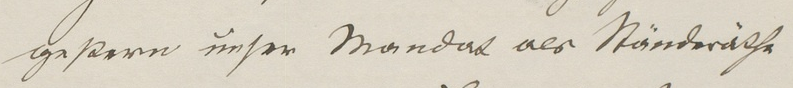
gestern unser Mandat als Ständeräthe
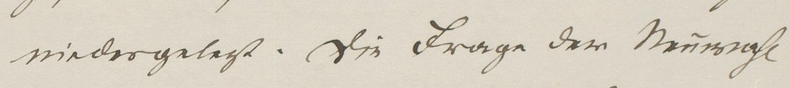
niedergelegt. Die Frage der Neuwahl
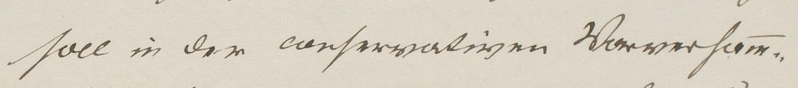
soll in der conservativen Vorversamm-
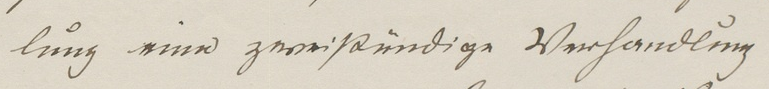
lung eine zweistündige Verhandlung
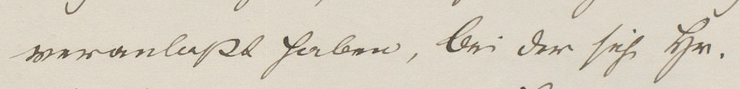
veranlaßt haben, bei der sich Hr.
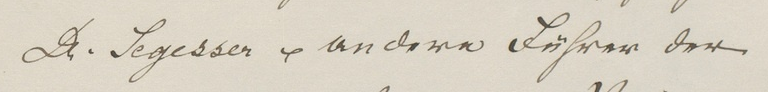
Dr. Segesser & andere Führer der
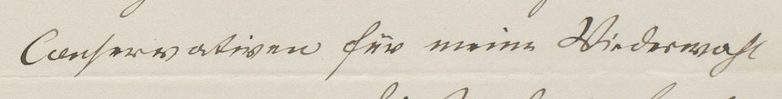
Conservativen für meine Wiederwahl
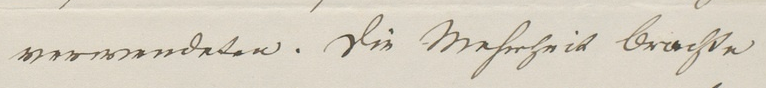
verwendeten. Die Mehrheit brachte
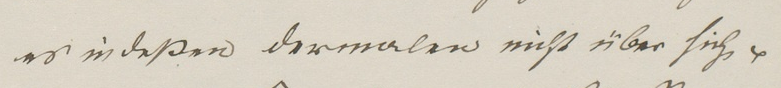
es indeßen dermalen nicht über sich &
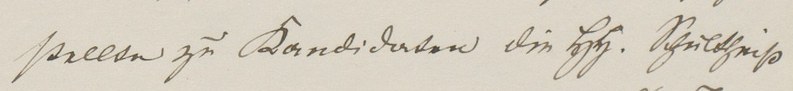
stellte zu Kandidaten die HH. Schultheiß
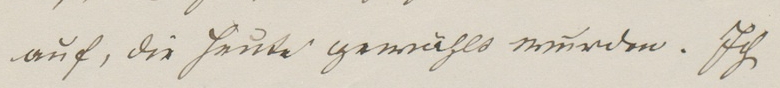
auf, die heute gewählt wurden. Ich
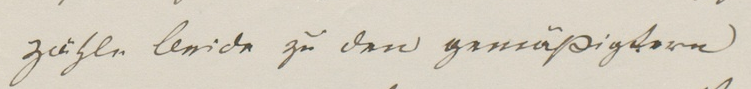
zähle beide zu den gemäßigtern
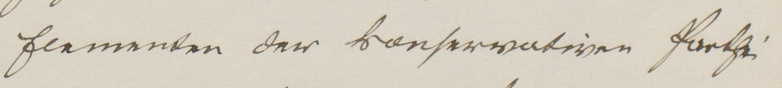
Elementen der konservativen Parthei
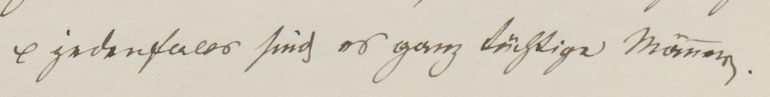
& jedenfalls sind es ganz tüchtige Männer.
